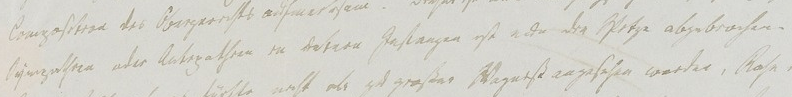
Sympathien oder Antipathien in unsern Instanzen ist nun die Spitze abgebrochen.
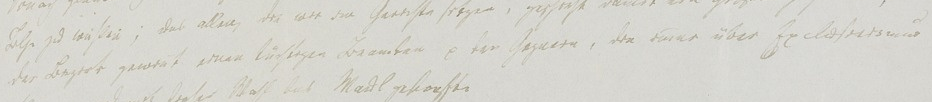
der Bezirk gewinnt einen tüchtigen Beamten & den Gegnern, die immer über Exclusivismus
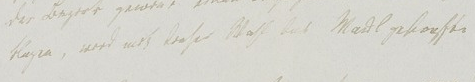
klagen, wird mit dieser Wahl das Maul gestopft.
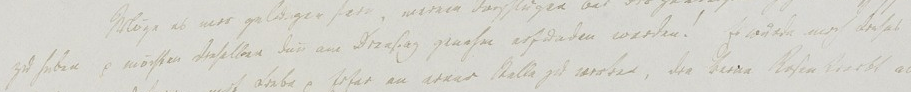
zu haben & möchten dieselben dann am Dienstag genehm erfunden werden! Es würde mich dieses
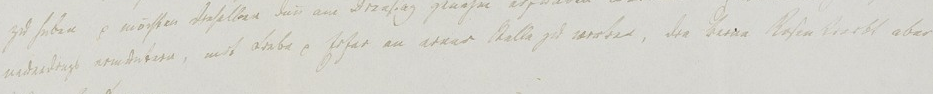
neuerdings ermuntern, mit Liebe & Eifer an einer Stelle zu wirken, die keine Rosen treibt aber
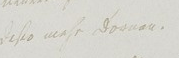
desto mehr Dornen.
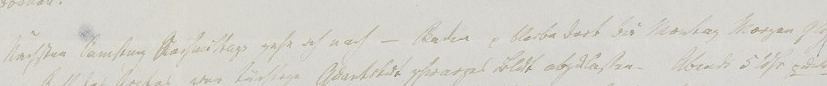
Nächsten Samstag Nachmittags gehe ich nach – Baden & bleibe dort bis Montag Morgen 9
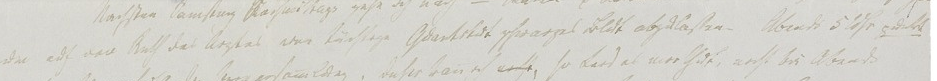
um auf den Rath des Arztes eine tüchtige Quantität schwarzes Blut abzulassen. Abends 5 Uhr punkt
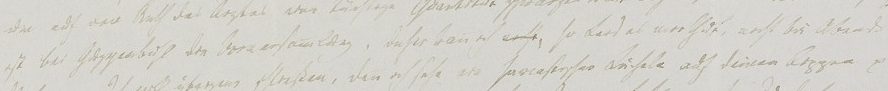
ist bei Guggenbühl die Vorversammlung, daher kann ich, so Leid es mir thut, nicht bis Abends
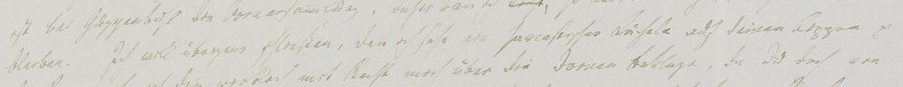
bleiben. Ich will übrigens schließen, denn ich sehe ein sarcastisches Lächeln auf deinen Lippen &
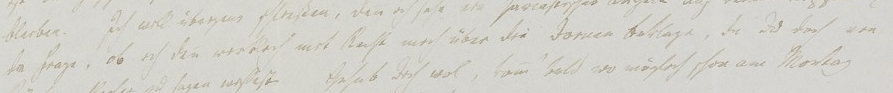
die Frage, ob ich denn wirklich mit Recht mich über die Dornen beklage, da Du doch von
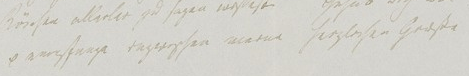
& empfange meine herzlichen Grüße.
